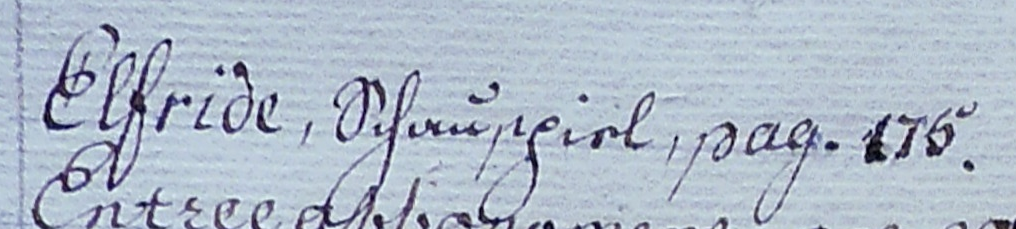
Elfride, Schauspiel, pag. 175.
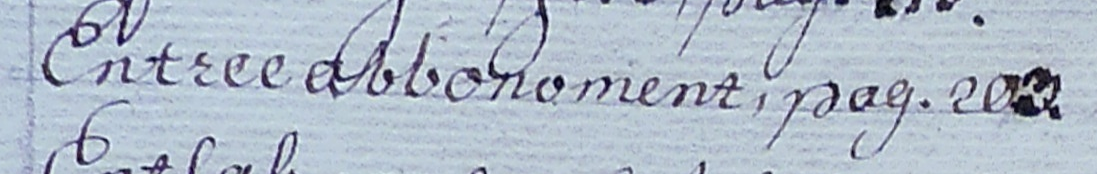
Entreeabbonoment, pag. 203.
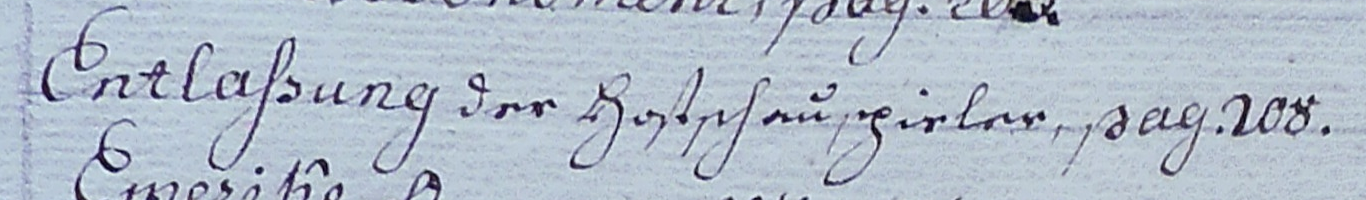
Entlassung der Hofschauspieler, pag. 208.
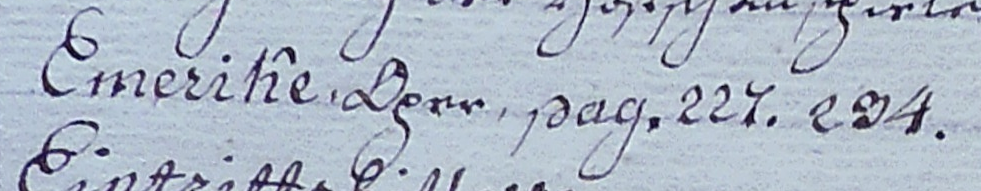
Emerike, Oper, pag. 227. 234.
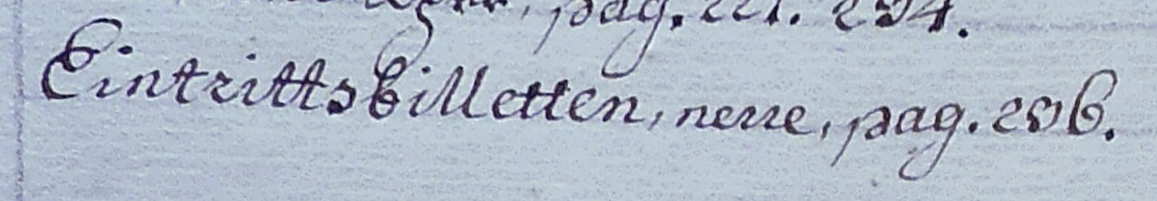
Eintrittsbilletten, neue, pag. 236.
